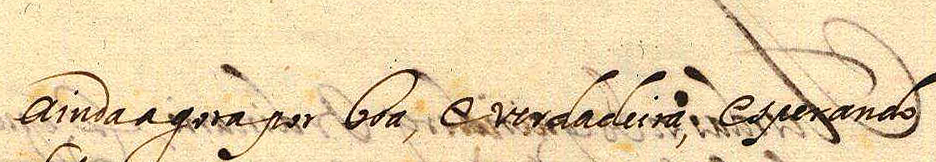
ainda agora por boa, e verdadeira, esperando
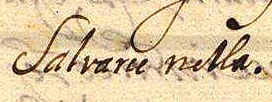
Salvarce nella.
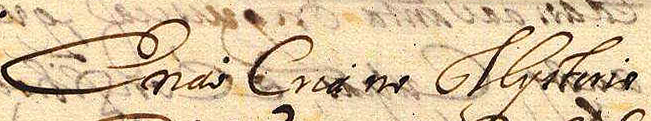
E naõ Cria no Mysterio
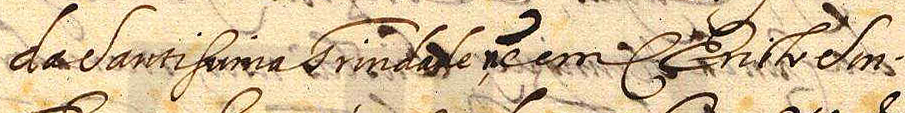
da Santissima Trindade, nē em Christo Sen
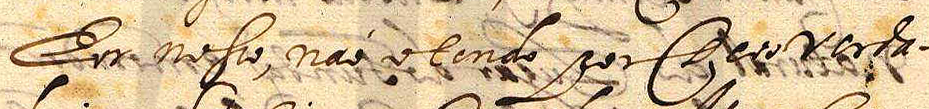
hor nosso, naõ o tendo por Deos verda
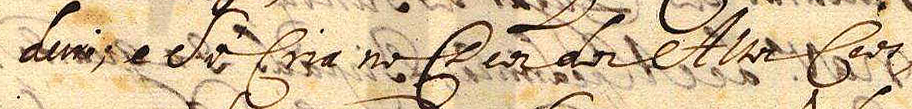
deiro; e Só Cria no Deos dos Altoz Ceos,
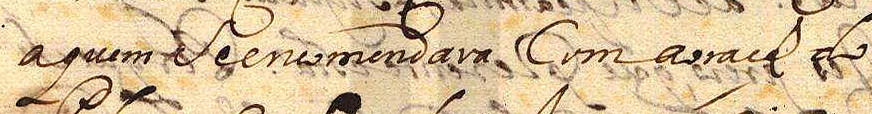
a quem Se encomendava Com a oraçaõ do
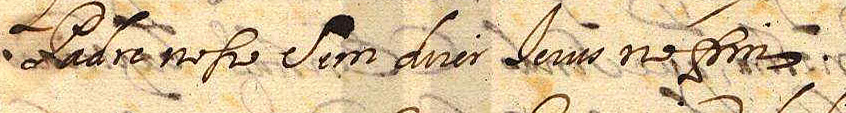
Padre nosso Sem dizer Iezus no fim.
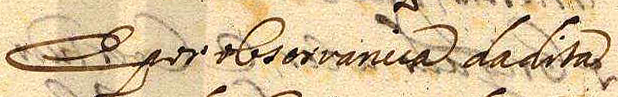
E por observancia da dita
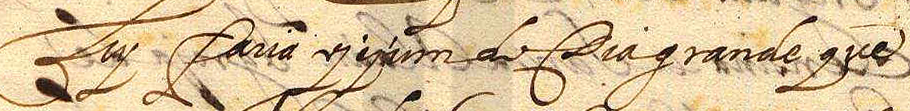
Ley fazia o jejum do Dia grande que
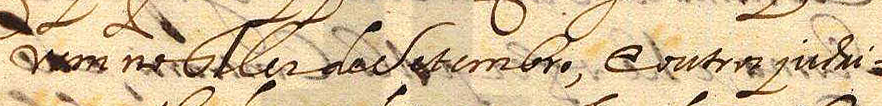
vem no Mez de Setembro, e outros judai
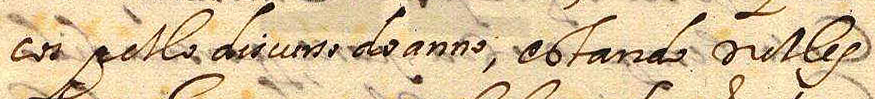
cos pello discurso do anno, estando nelles
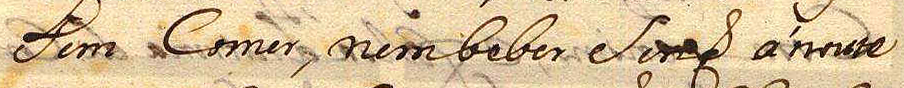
Sem Comer, nem beber Senaõ á noute
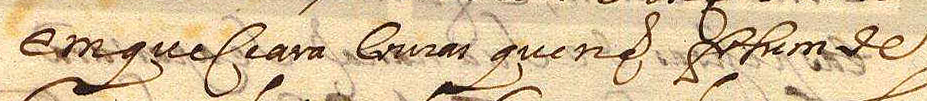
em que Ceara Couzas que naõ fossem de
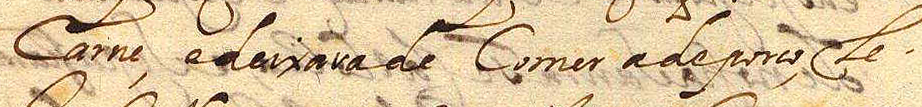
Carne, e deixava de Comer a de porco, Le
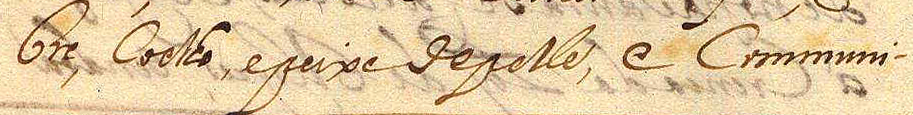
bre, Coelho, e peixe de pelle, e Communi
